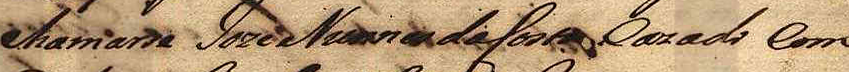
chamarse Ioze Nunnes da Costa Cazado Com
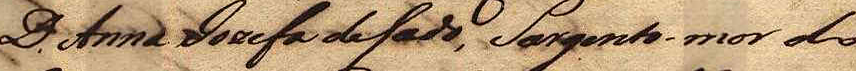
D. Anna Iozefa de Cado, Sargento-mor do
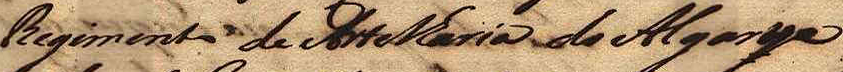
Regimento de Artelharia do Algarve
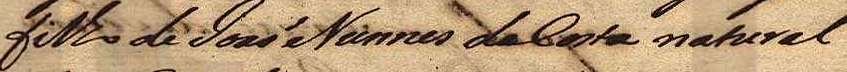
filho de Ioaõ Nunnes da Costa natural
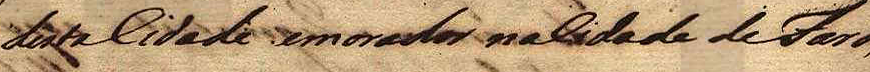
desta Cidade: e morador na Cidade de Faro,
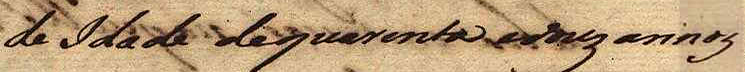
de Idade de quarenta e douz annoz.
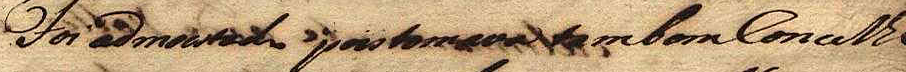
Foi admoestado pois tomava tam bom Concelho
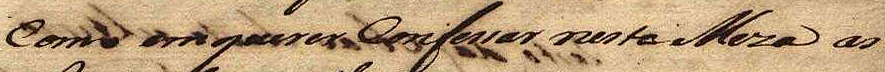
Como em querer Confessar nesta Meza as
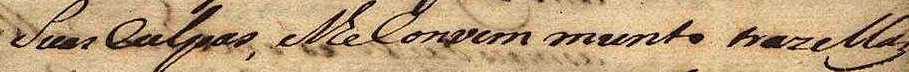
Suas Culpas, e lhe Convem munto trazellaz
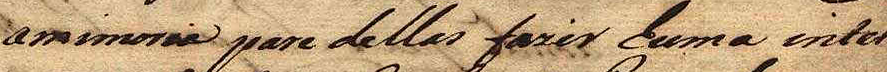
a mimoria para dellas fazer huma intei
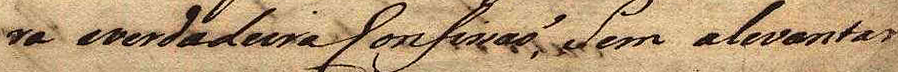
ra e verdadeira Confissaõ, Sem a levantar
